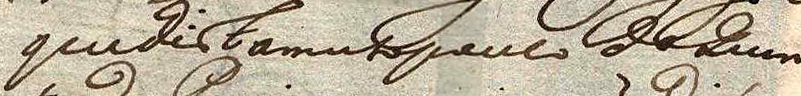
que dista muto pouco da Quin
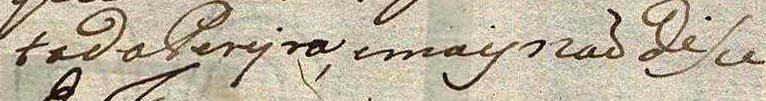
ta da Perejra, e mais naõ disse
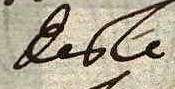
deste
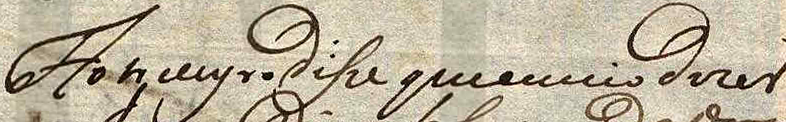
Ao treceyro disse que ouuio dizer
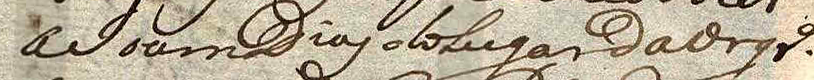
a Ioam Dias do lugar da vrgr.o
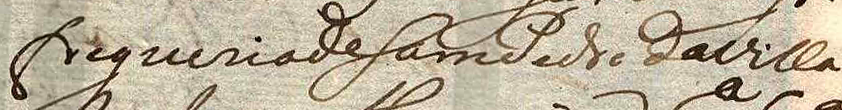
freguezia de sam Pedro da Villa
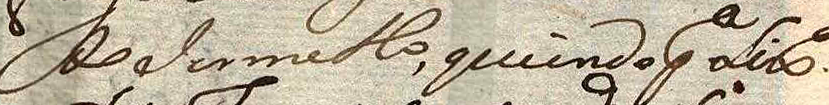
do Iermello, que indo pa Lix.a
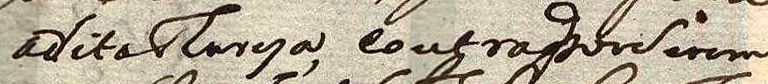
a dita Thareza, e outra por serem
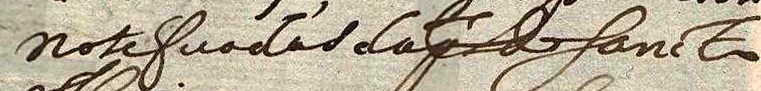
noteficadas da pte do sancto
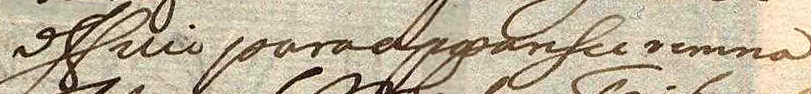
officio para apparesserem na
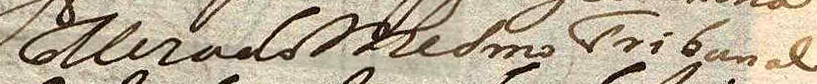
Meza do Mesmo Tribunal
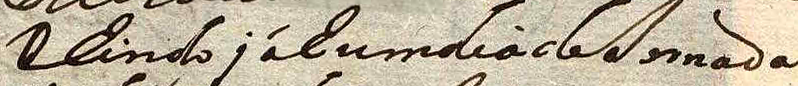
E hindo já hum dia de Iornada
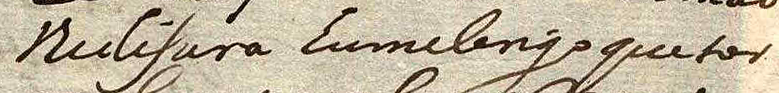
lhe dissera hum clerigo que tor
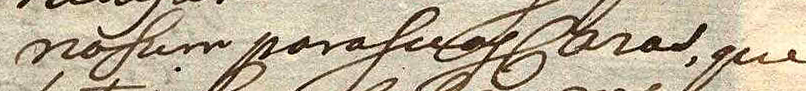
nassem para suas Cazas, que
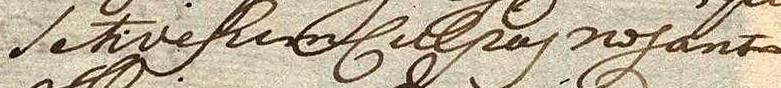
se tivessem Culpas no santo
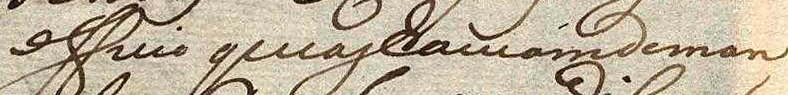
officio que as hauiam de man
